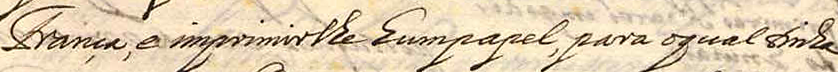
França, e imprimirlhe hum papel, para o qual tinha
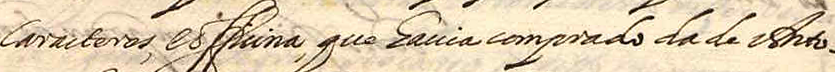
caracteres, e officina, que hauia comprado da de Anto
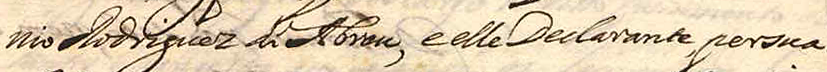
nio Rodriguez de Abreu, e elle Declarante, persua
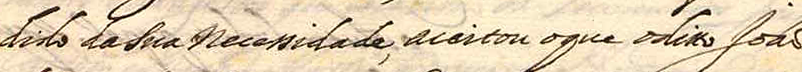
dido da sua necessidade, aceitou o que o ditto João
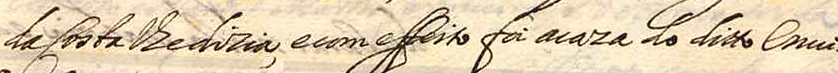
da Costa lhe dizia, e com effeito foi a caza do ditto Enui
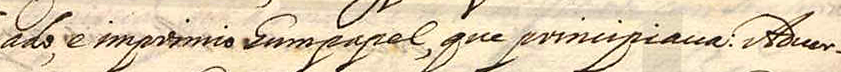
ado, e imprimio hum papel, que principiaua: Aduer
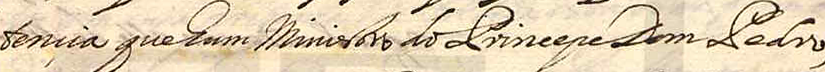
tençia que hum Ministro do Princepe Dom Pedro;
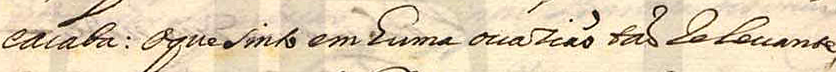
e acaba: O que sinto em huma occaziaõ taõ Releuante
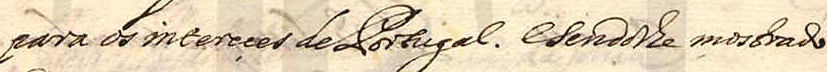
para os intereçes de Portugal. e sendolhe mostrado
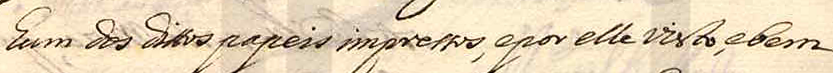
hum dos dittos papeis impressos, e por elle visto, e bem
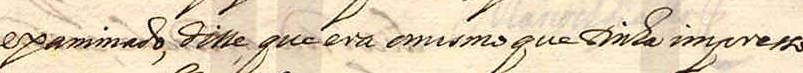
examinado, disse que era o mesmo que tinha impresso
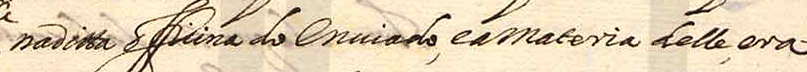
na ditta officina do Enuiado, e a materia delle era
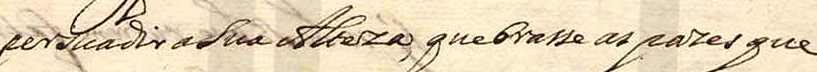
persuadir a Sua Alteza quebrasse as pazes que
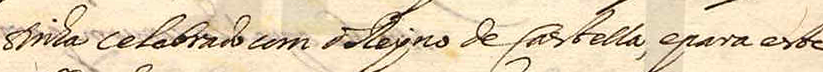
tinha celebrado com o Reyno de Castella, e para este
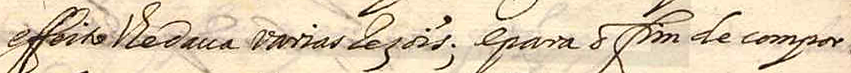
effeito lhe daua varias Rezois̄; e para o fim de compor
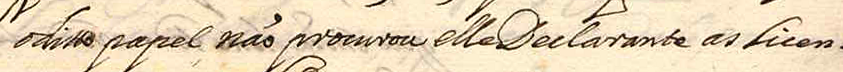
o ditto papel naõ procurou elle Declarante as licen
